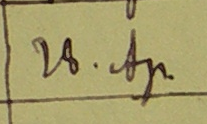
28. April
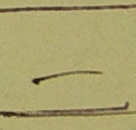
-
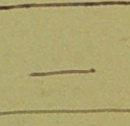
-
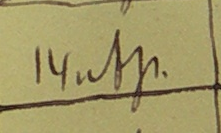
14. April
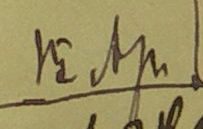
15. April
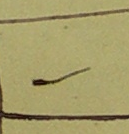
-
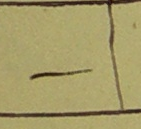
-
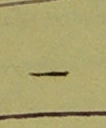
-
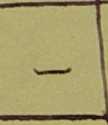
-
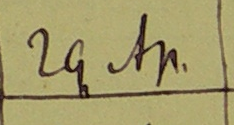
30. April
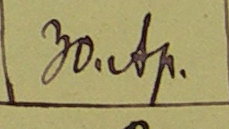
30. April
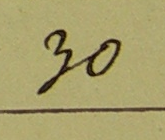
30
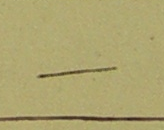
-
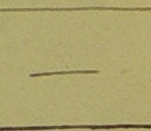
-
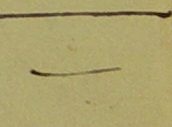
-
